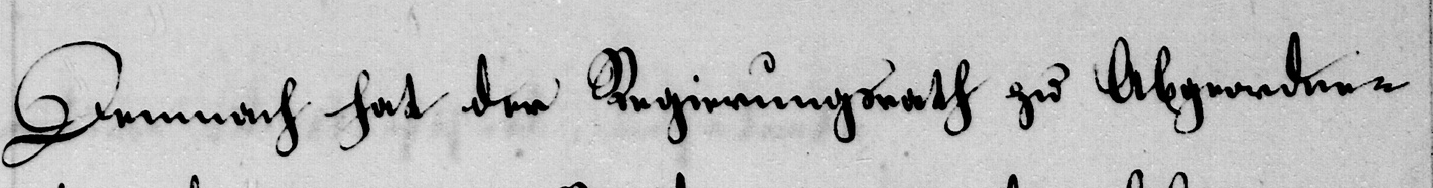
Demnach hat der Regierungsrath zu Abgeordne¬
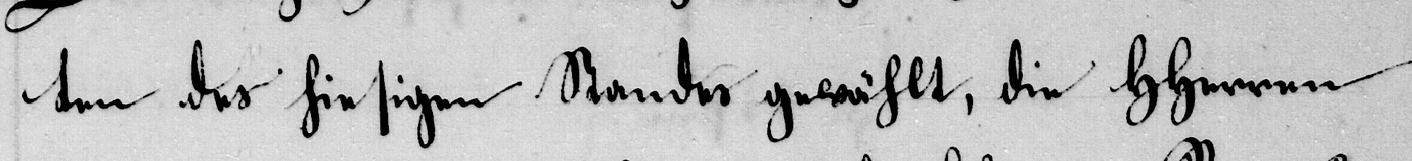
ten des hiesigen Standes gewählt, die HHerren
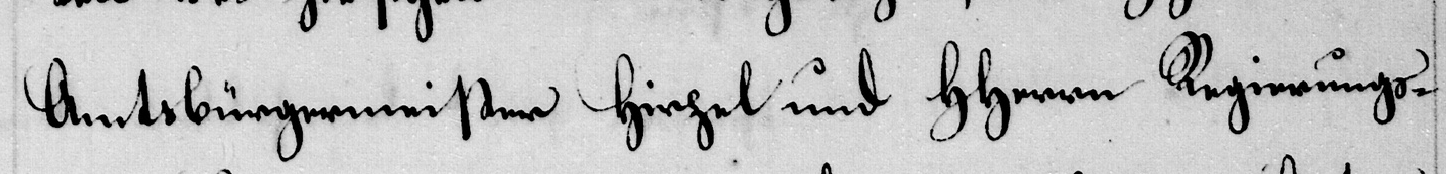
Amtsbürgermeister Hirzel und HHerren Regierungs¬
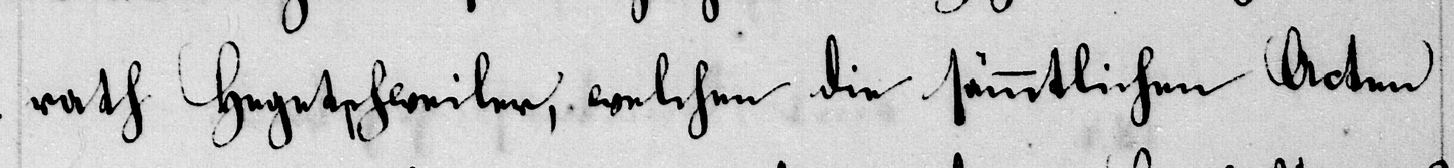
rath Hegetschweiler, welchen die sämmtlichen Acten
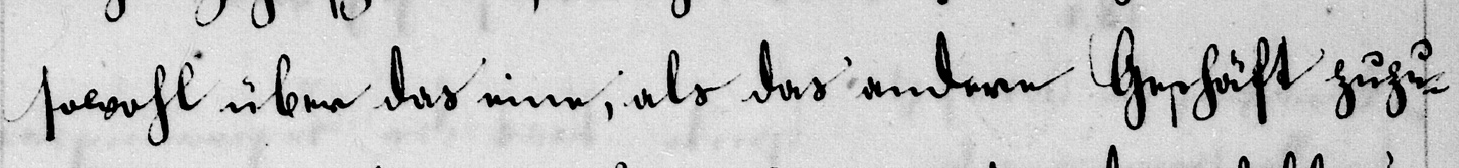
sowohl über das eine, als das andere Geschäft zuzu¬
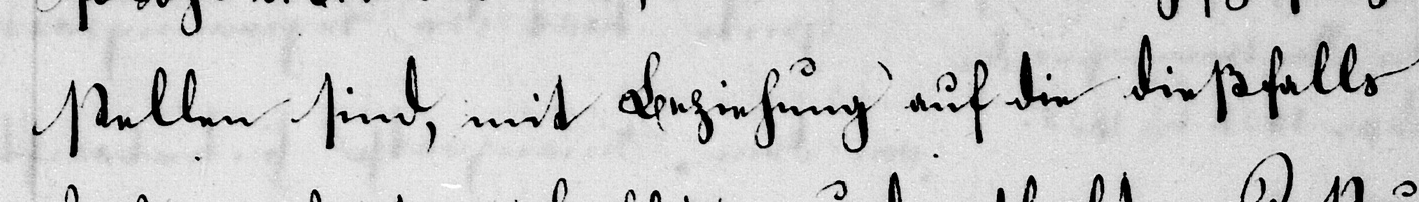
stellen sind, mit Beziehung auf die dießfalls
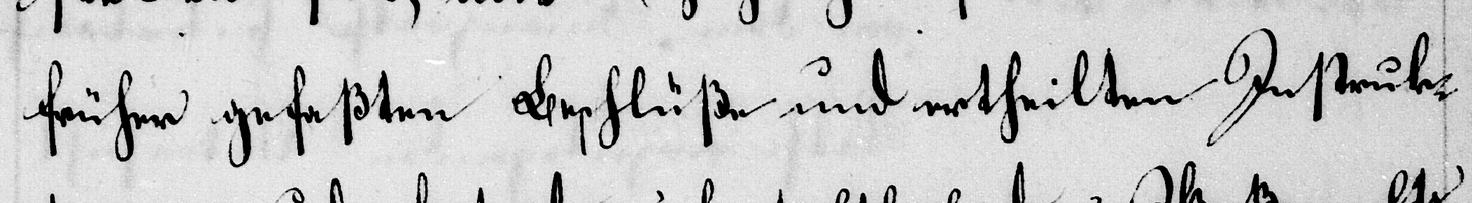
früher gefaßten Beschlüße und ertheilten Instruk¬
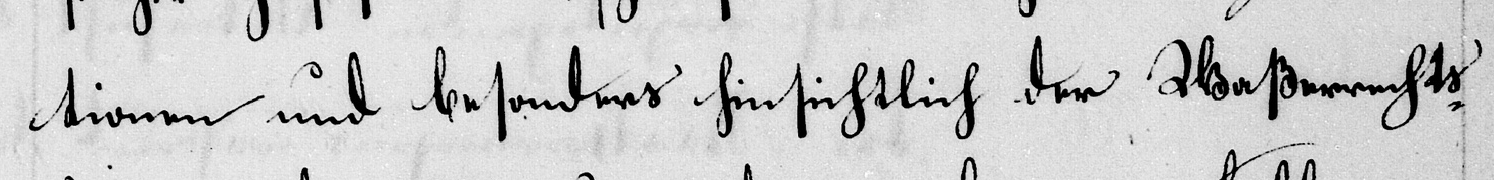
tionen und besonders hinsichtlich der Waßerrechts¬
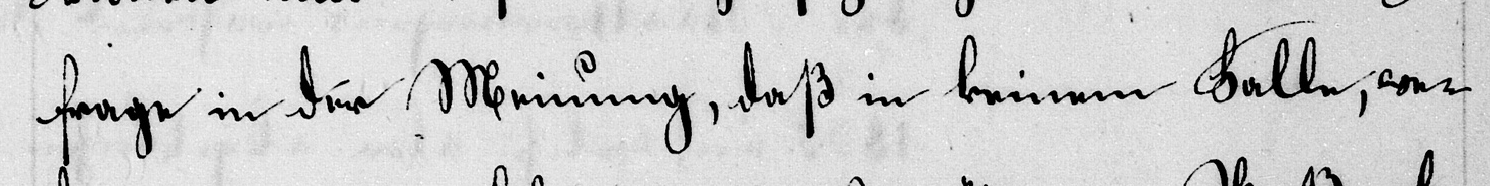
frage in der Meinung, daß in keinem Falle, we¬
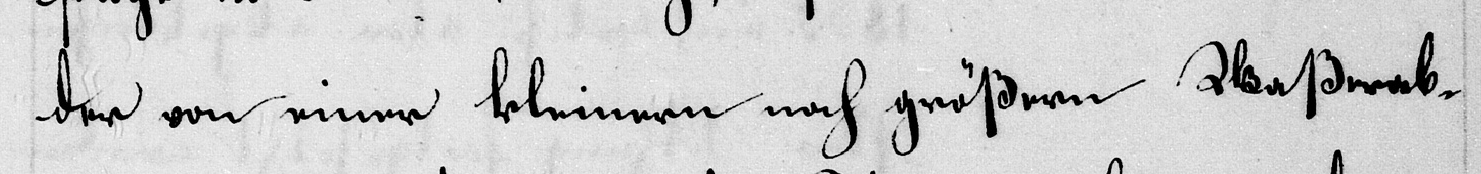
der von einer kleinen noch größern Waßerab¬
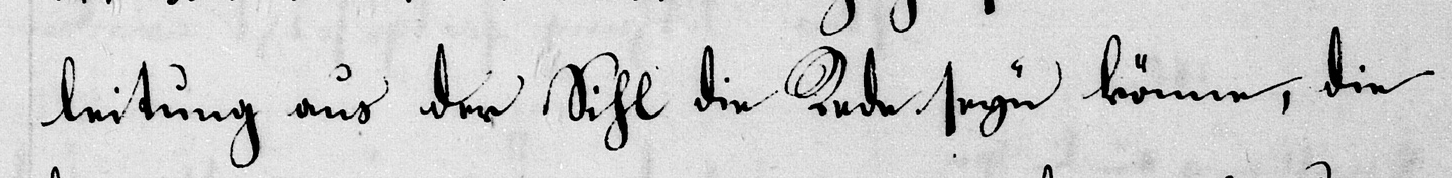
leitung aus der Sihl die Rede seyn könne, die
